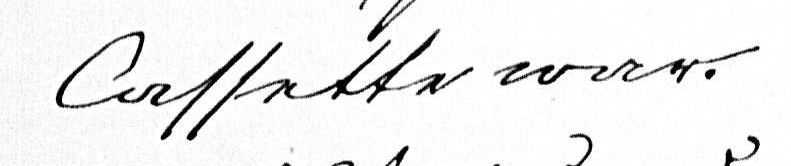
Casette war.
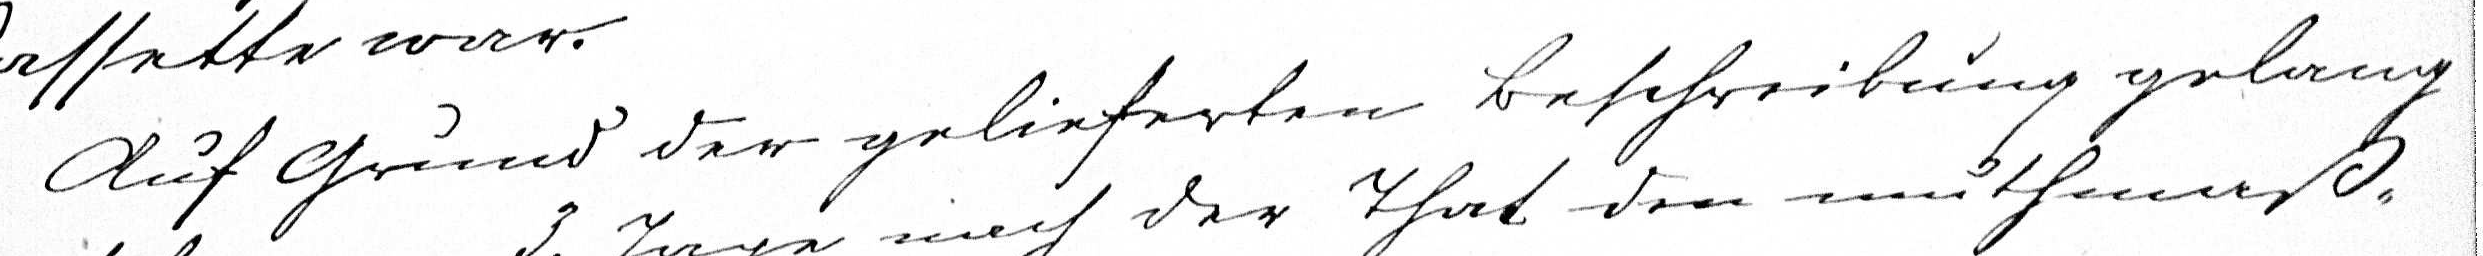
Auf Grund der gelieferten Beschreibung gelang
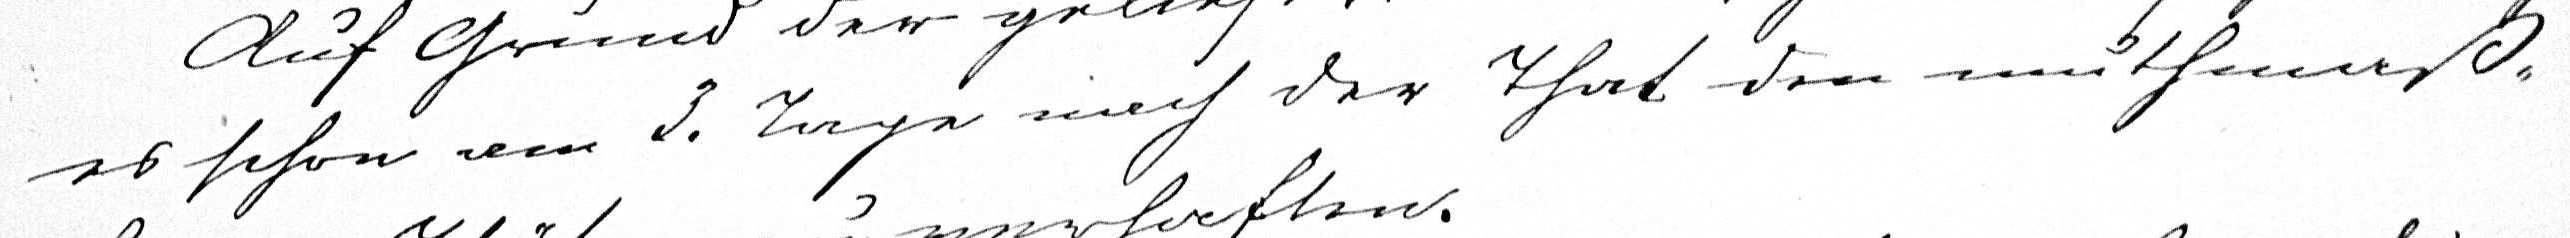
es schon am 3. Tage nach der That den muthmaß¬
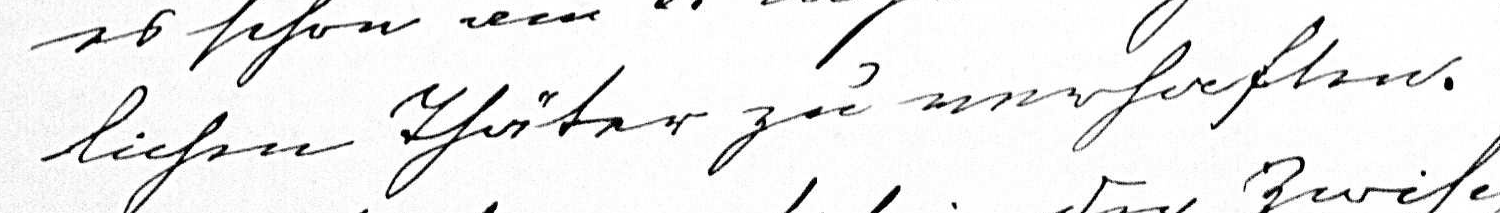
lichen Thäter zu verhaften.
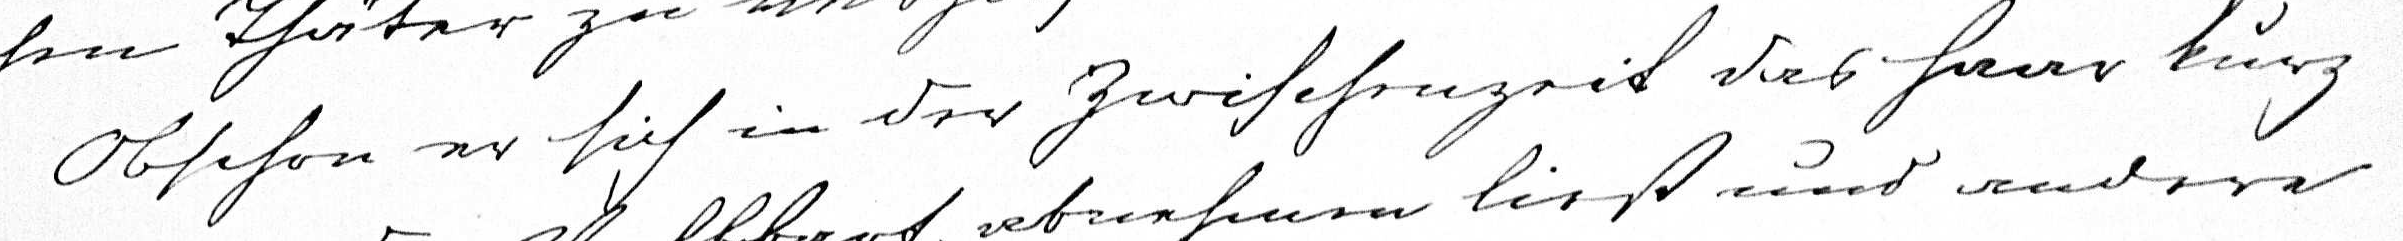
Obschon er sich in der Zwischenzeit das Haar kurz
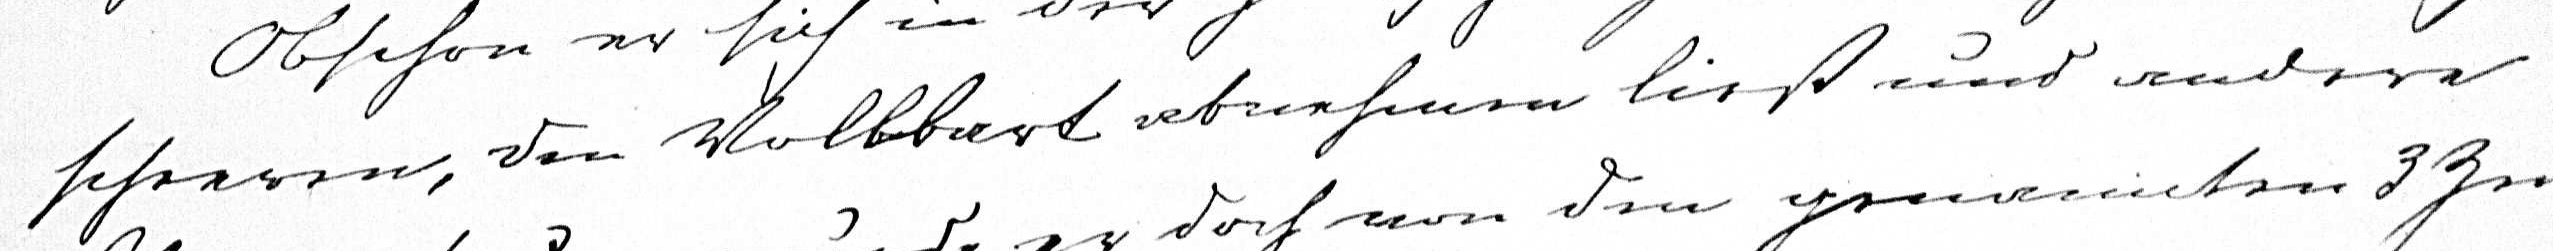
scheeren, den Vollbart abnehmen ließ und andere
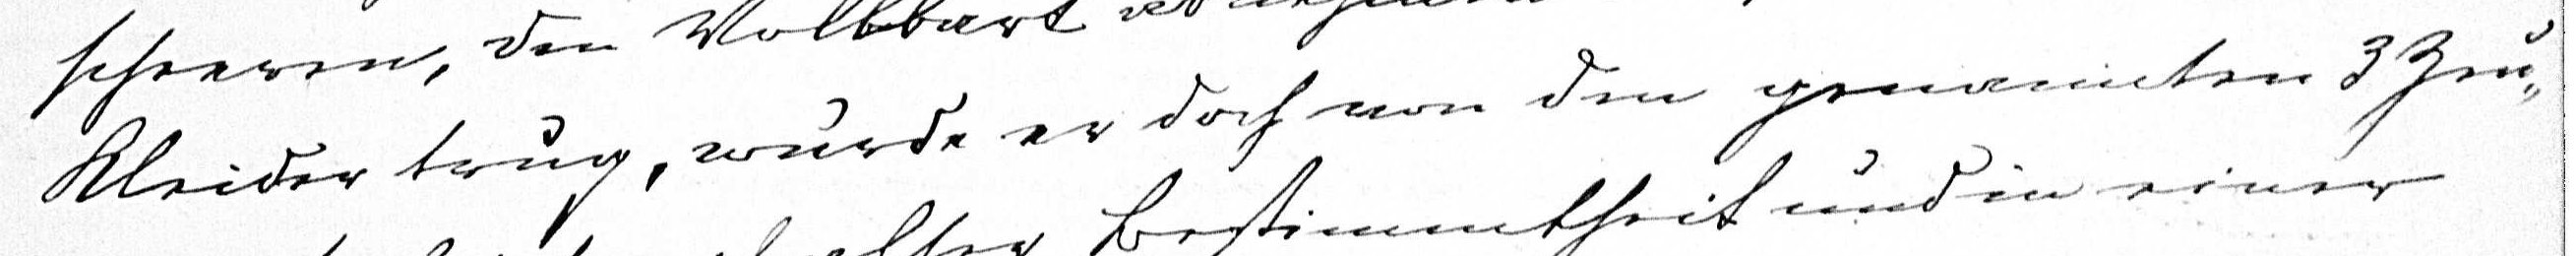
Kleider trug, wurde er doch von den genannten 3 Zeu¬
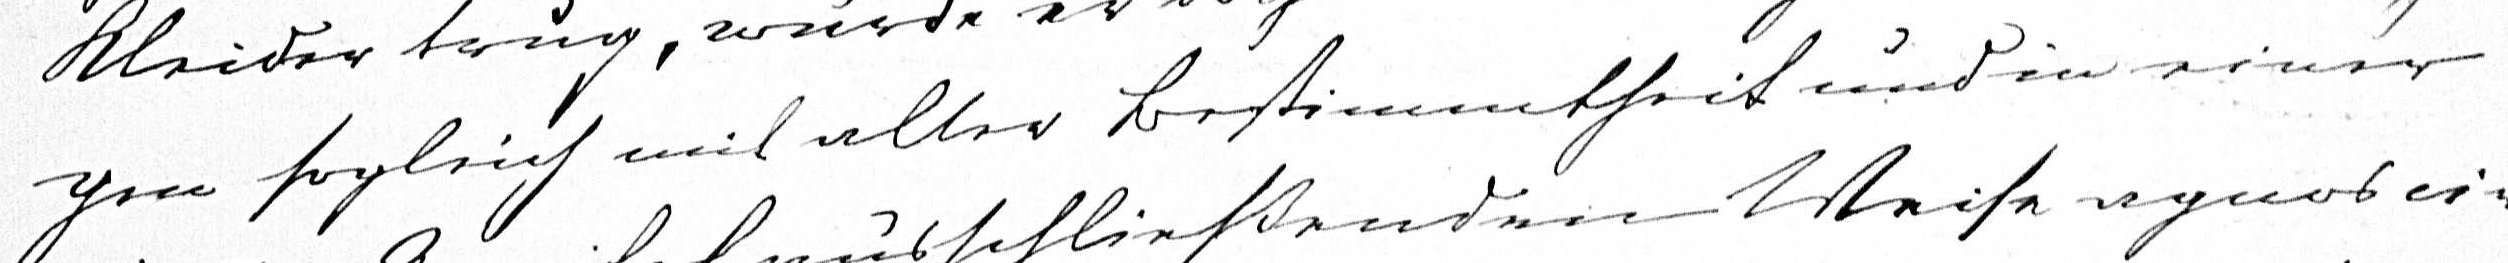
gen sogleich mit aller Bestimmtheit und in einer
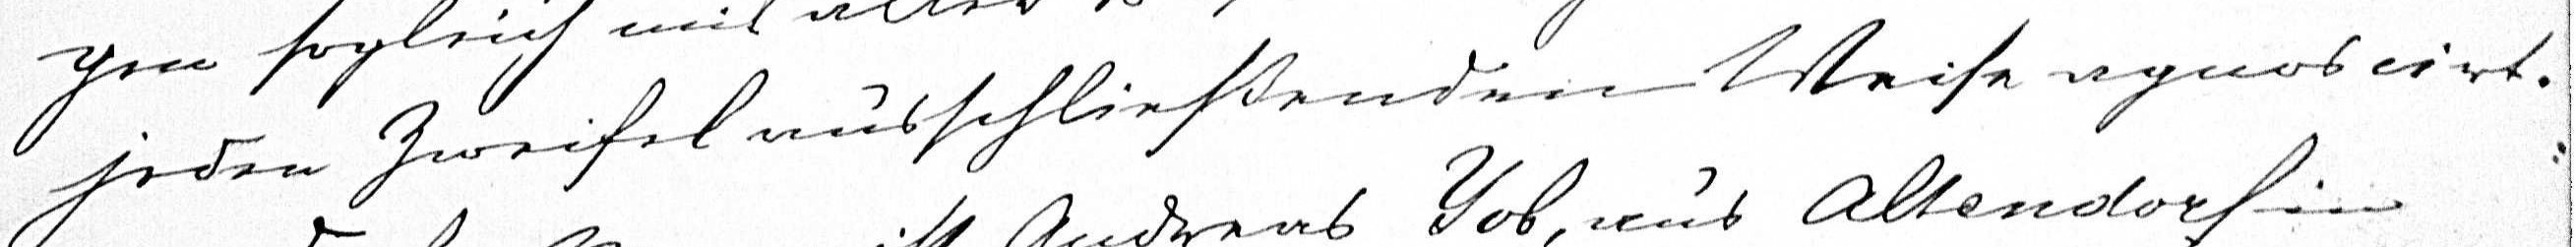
jeden Zweifel ausschließenden Weise agnoscirt.
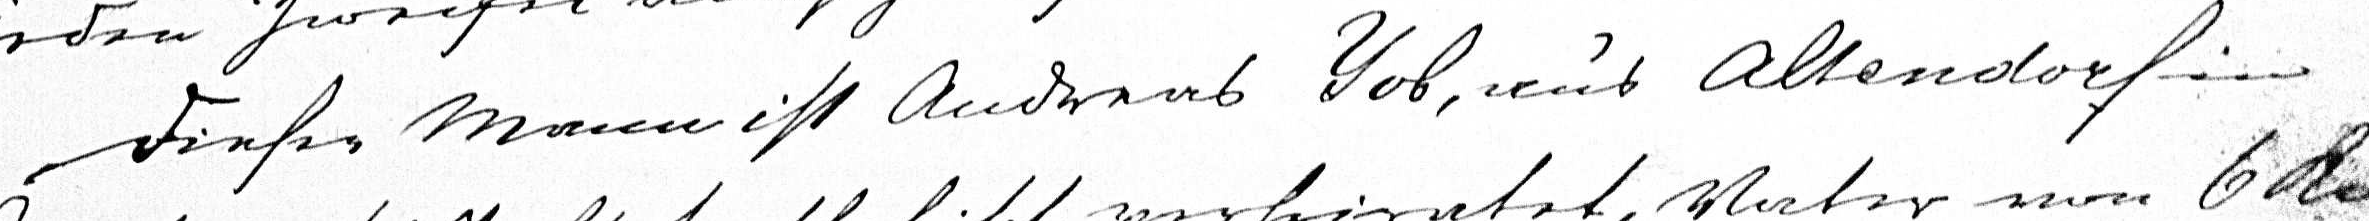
Dieser Mann ist Andreas Job, aus Altendorf in
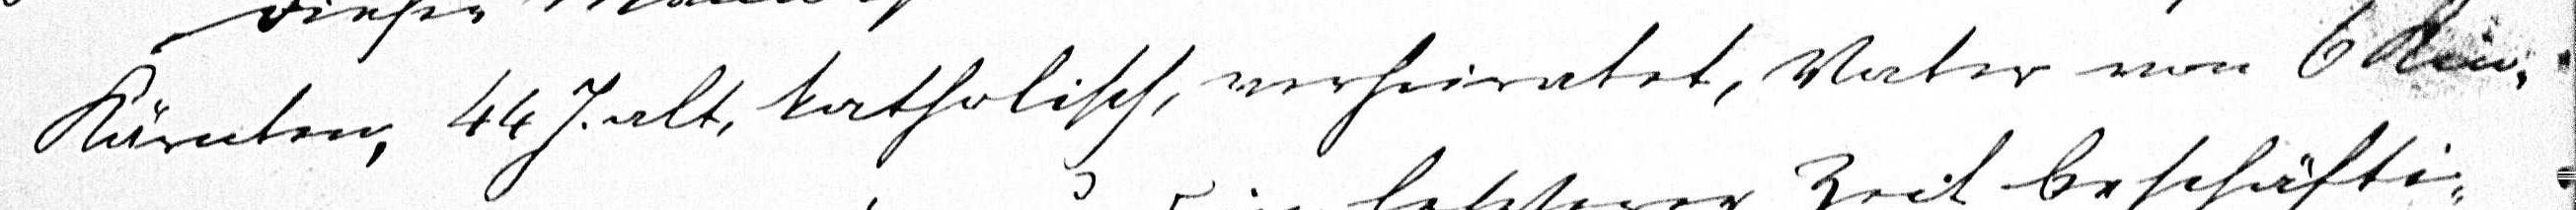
Kärnten, 44 J. alt, katholisch, verheiratet, Vater von 6 Kin¬
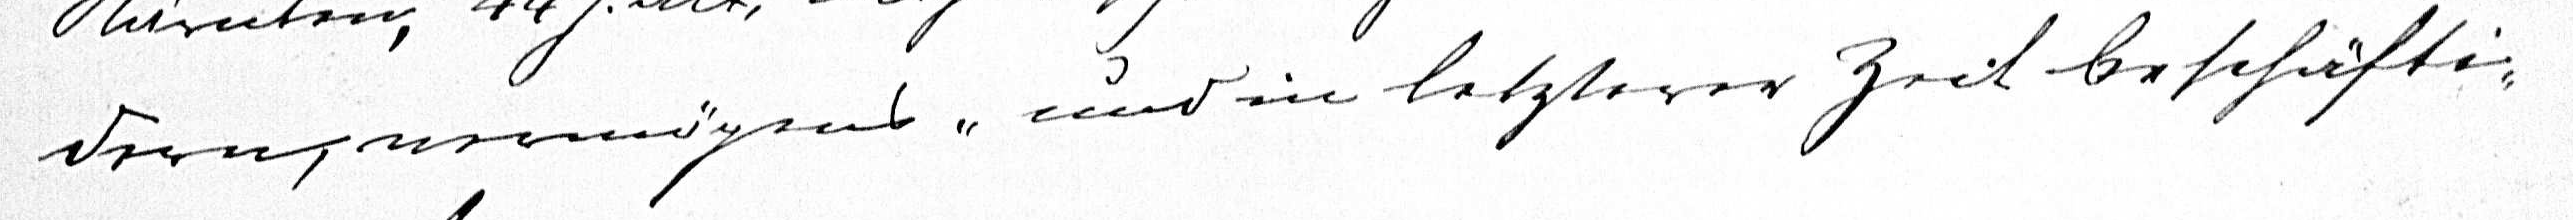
dern, vermögens- und in letzterer Zeit beschäfti¬
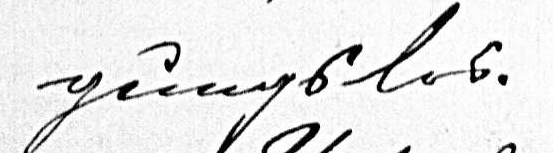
gungslos.
